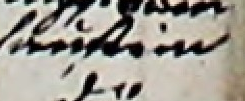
haustein
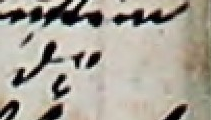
Do
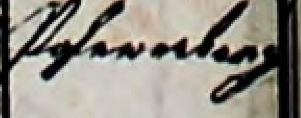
„
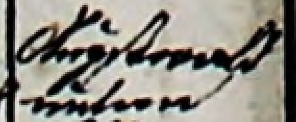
P???erberg
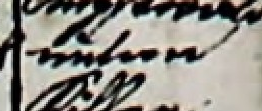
Augstwald
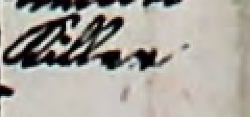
untern Killer
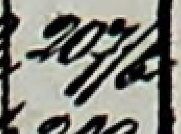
207/b
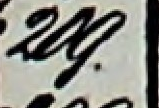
209
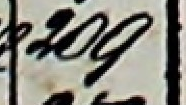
209
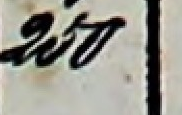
250
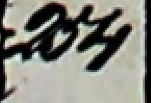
254
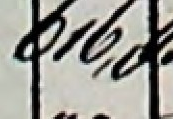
616,0
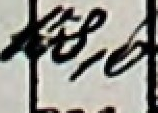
158,6
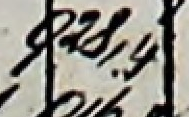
928,4
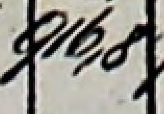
916,8
